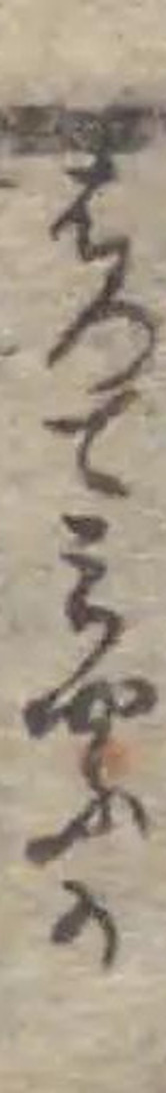はつてみやうか
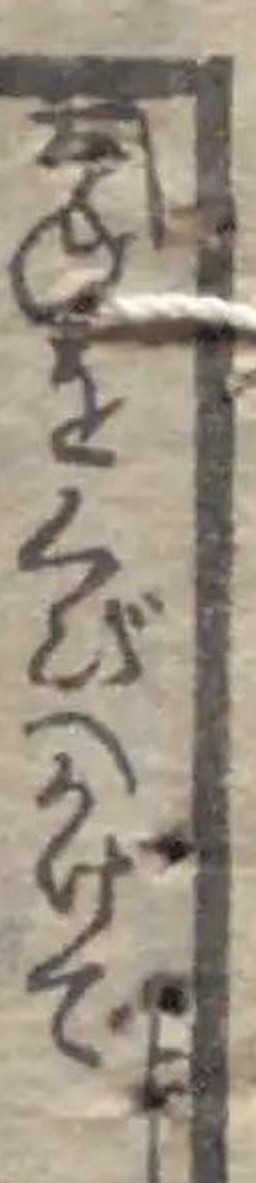〽かねをくびへかけて
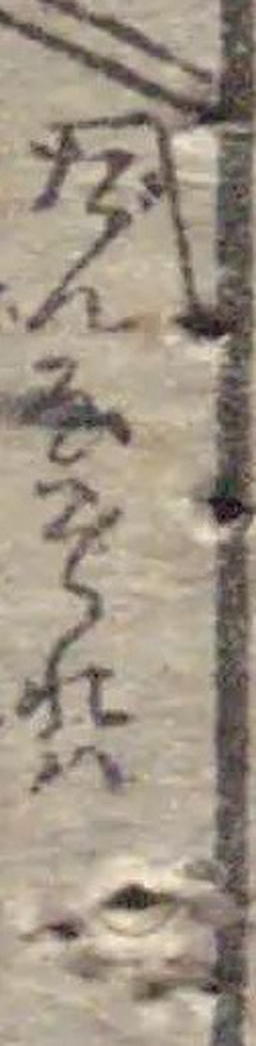〽だんなそれは
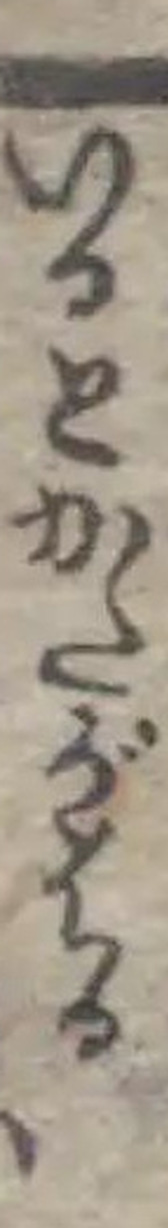いるとかたがはる
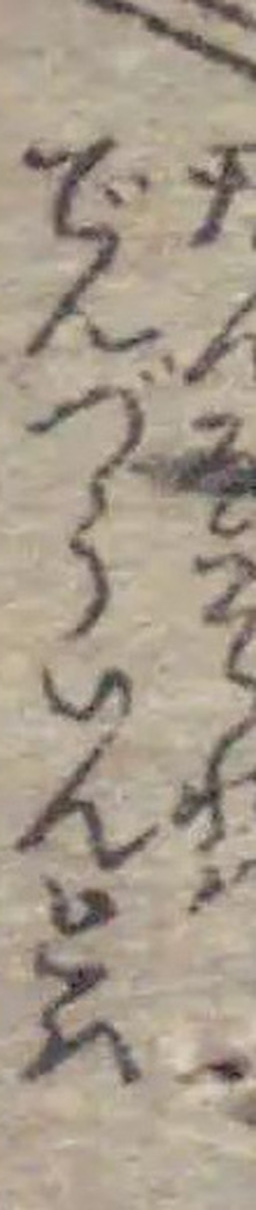でんづういんとは
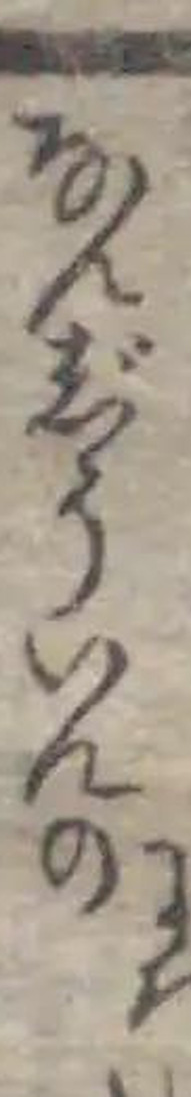なんじういんの
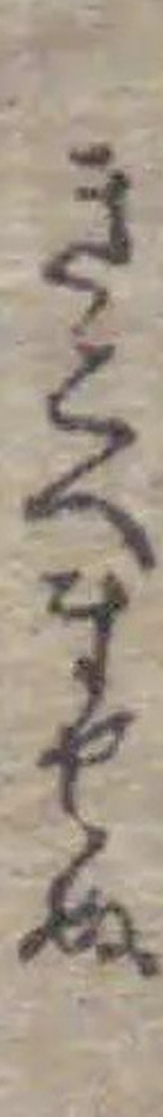きこへませぬ
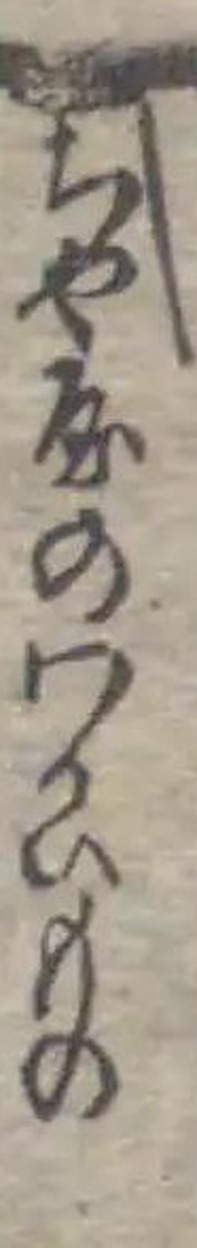〽ちや屋のわかいもの
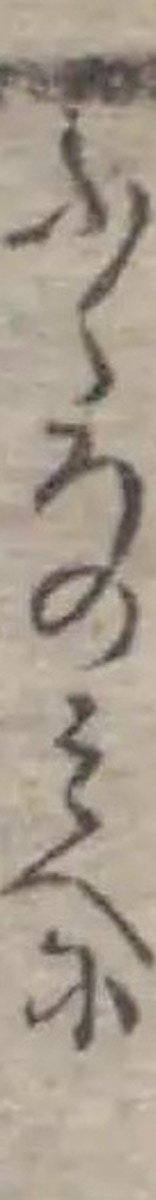ふくろのみへに
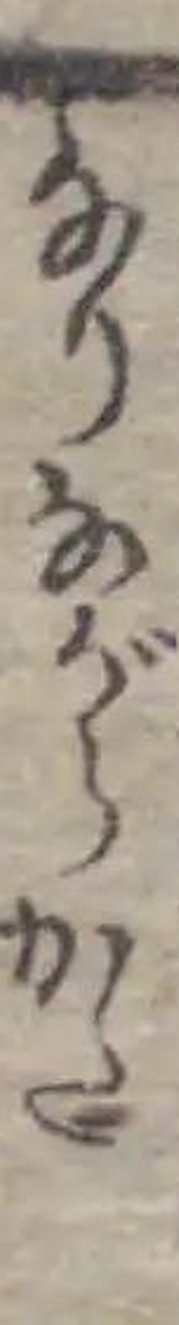なりながらかた
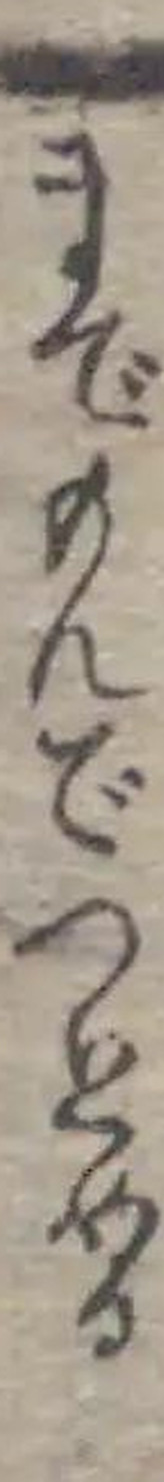までもんでつとめる
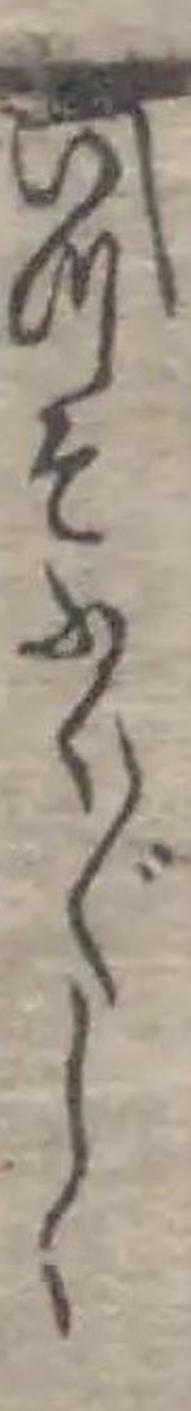〽いつそふく〴〵しく
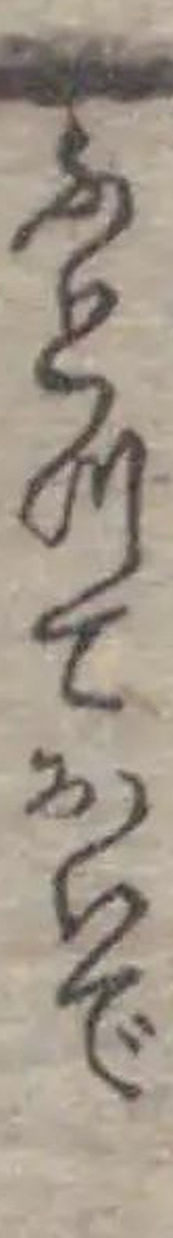ふとつておいで
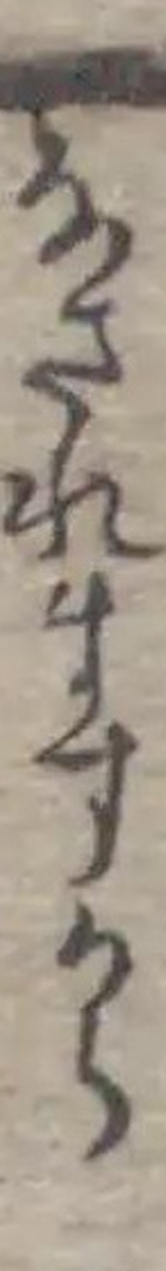なされますから
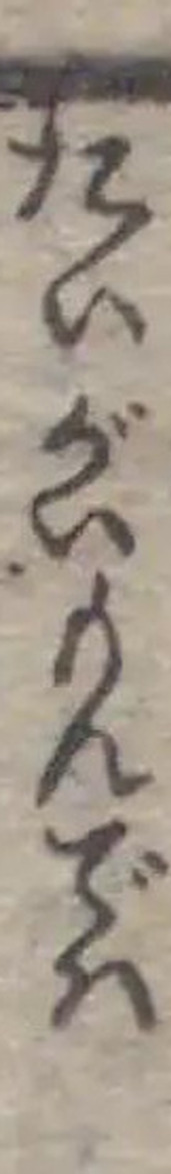たいがいもんでは
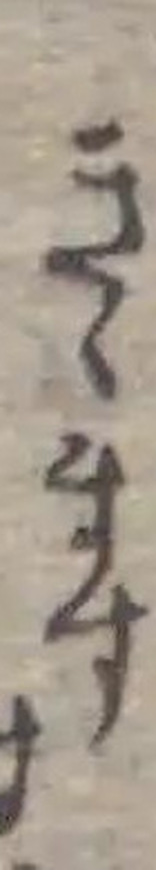ききます
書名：福壽海旡量品玉 3巻
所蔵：国立国会図書館 National Diet Library, JAPAN
